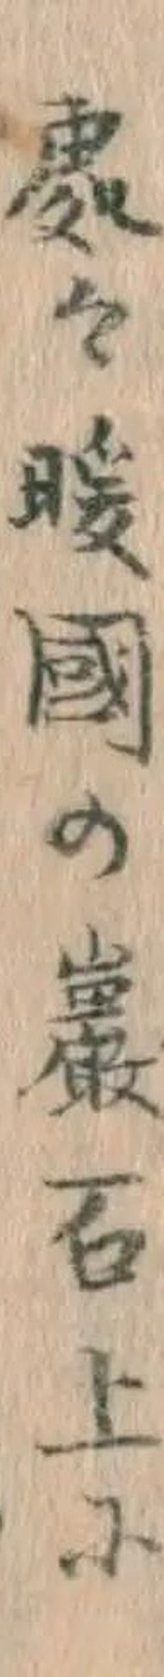処々暖国の巌石上に
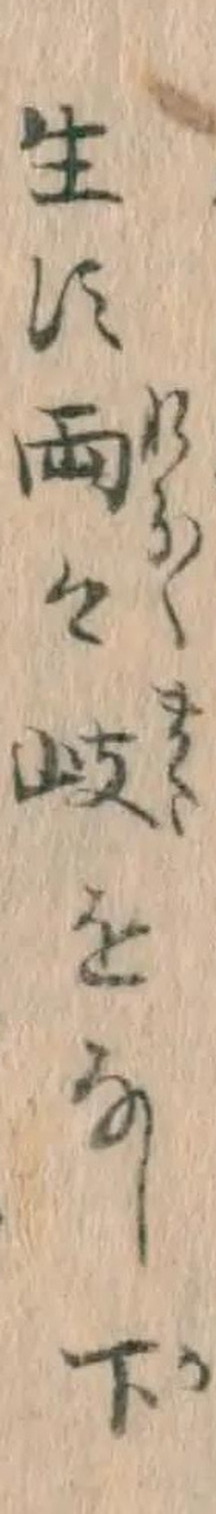生す両々岐をなし下
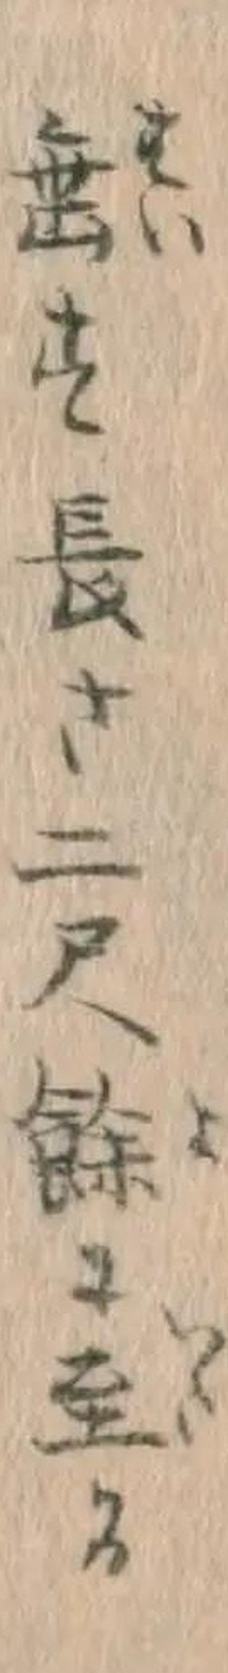垂す長さ二尺余に至る

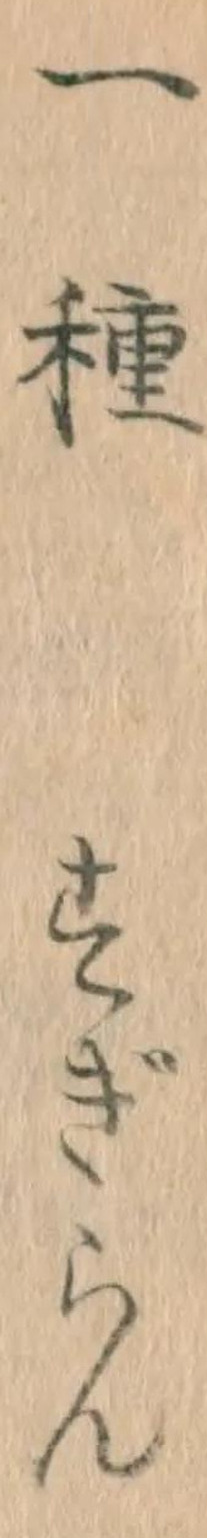一種すぎらん
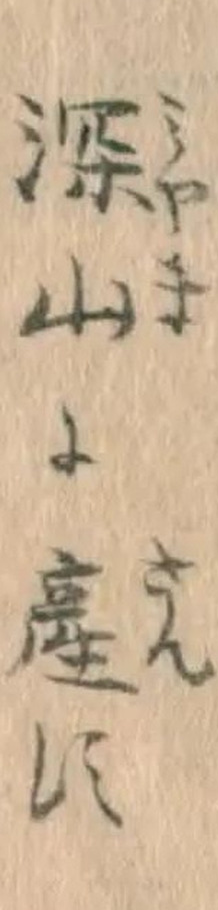深山に産す
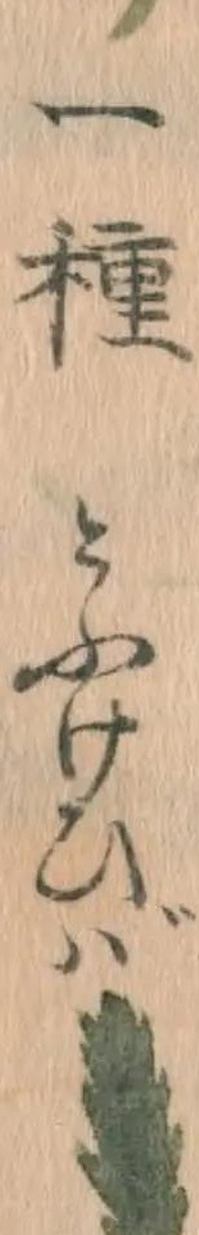一種とふけひば
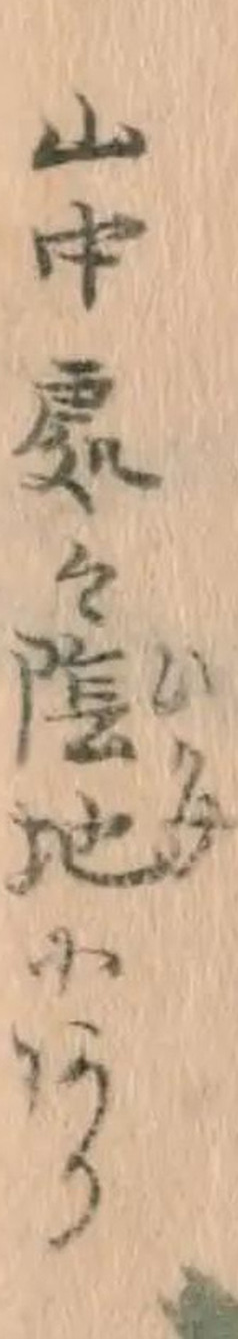山中処々陰地にあり
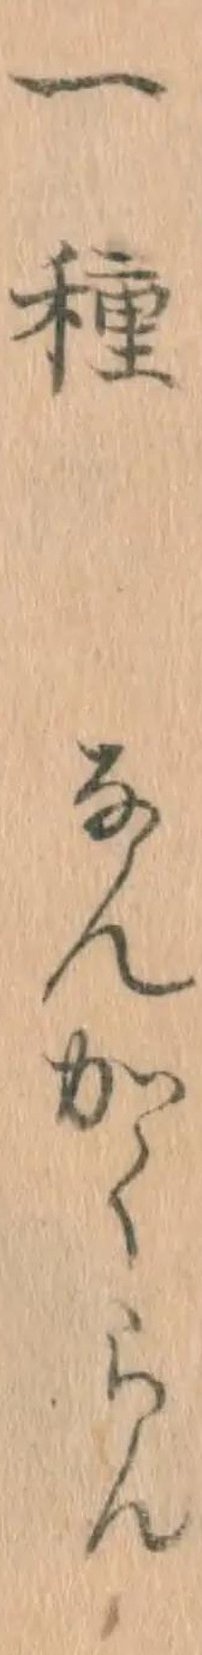一種なんかくらん
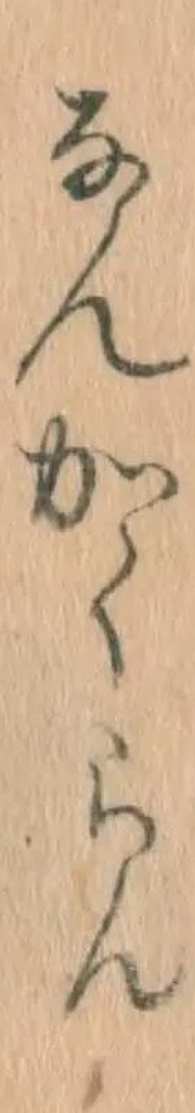なんかくらん
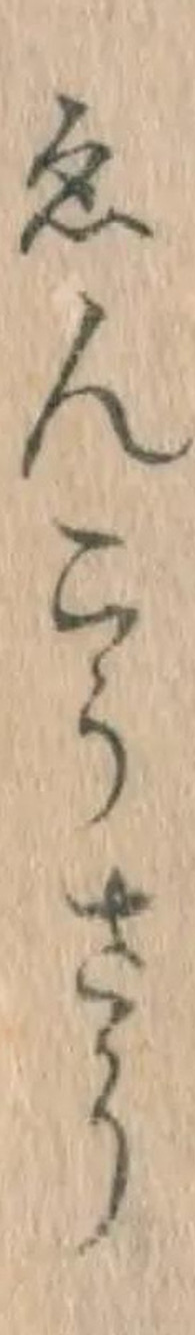ゑんこうさう
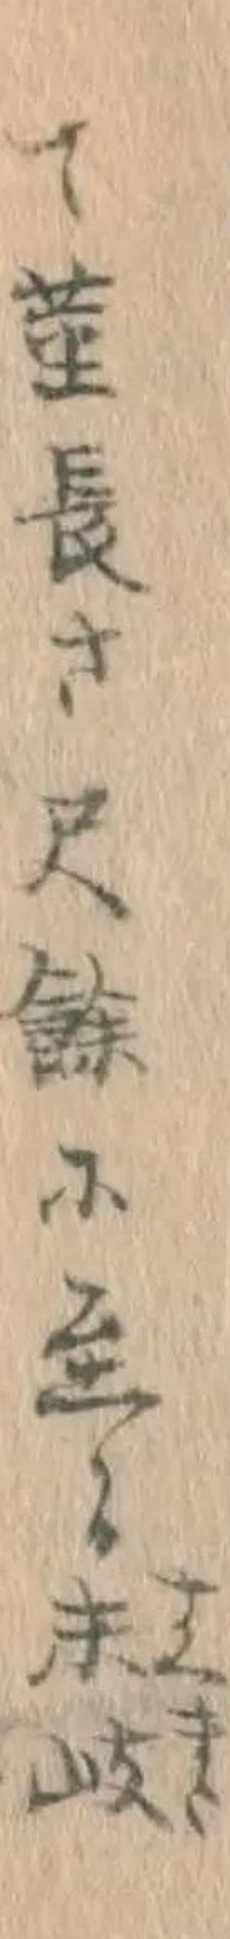て茎長さ尺余に至る末岐
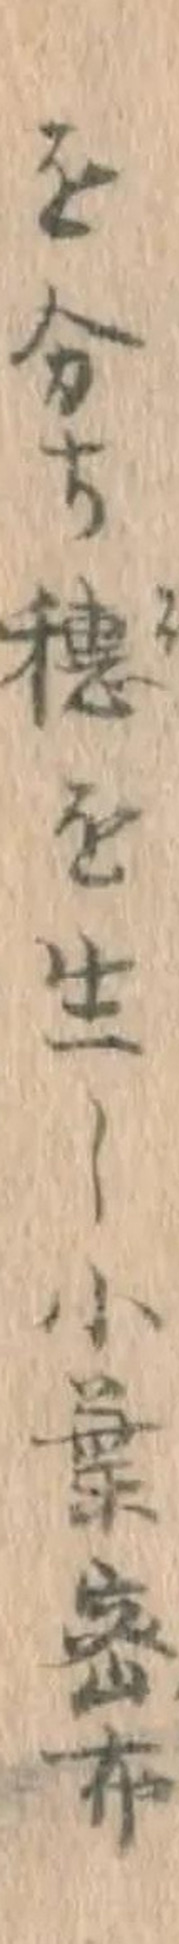を分ち穂を生し小葉密布
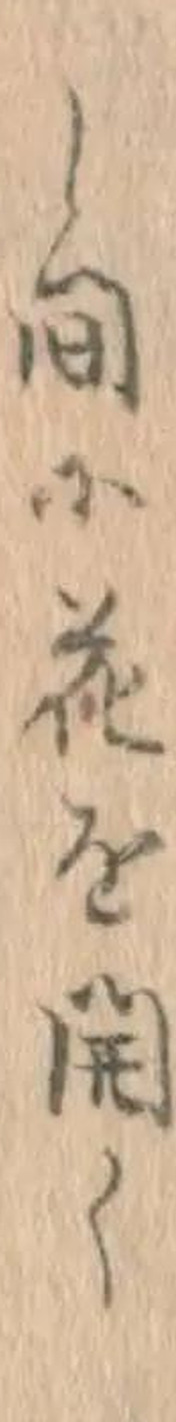し間に花を開く

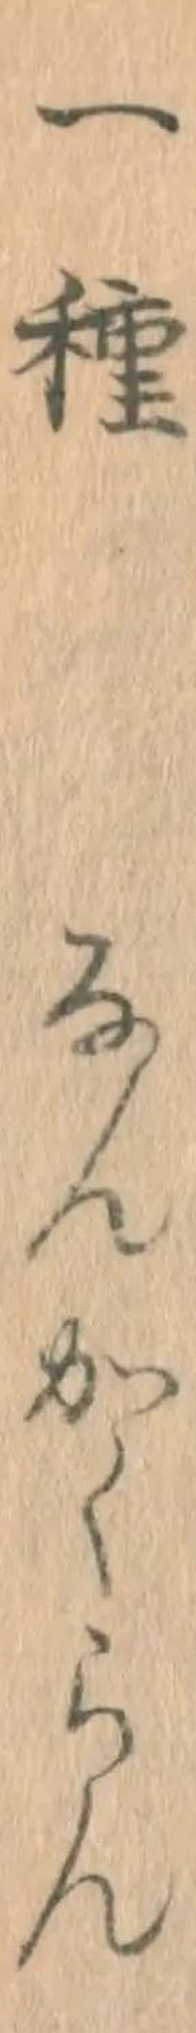一種なんかくらん
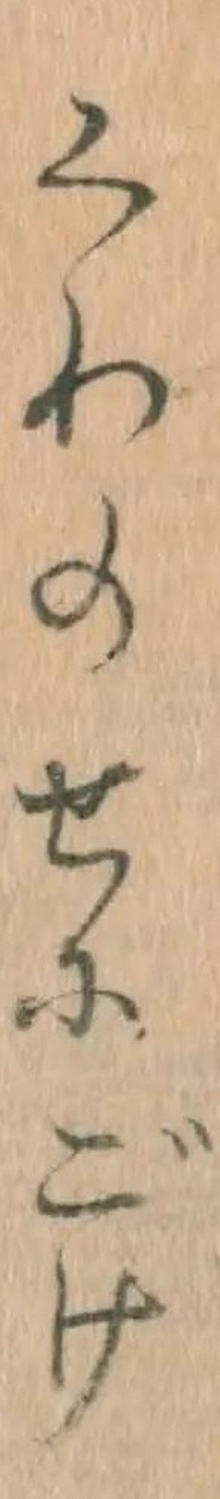くわのせにごけ
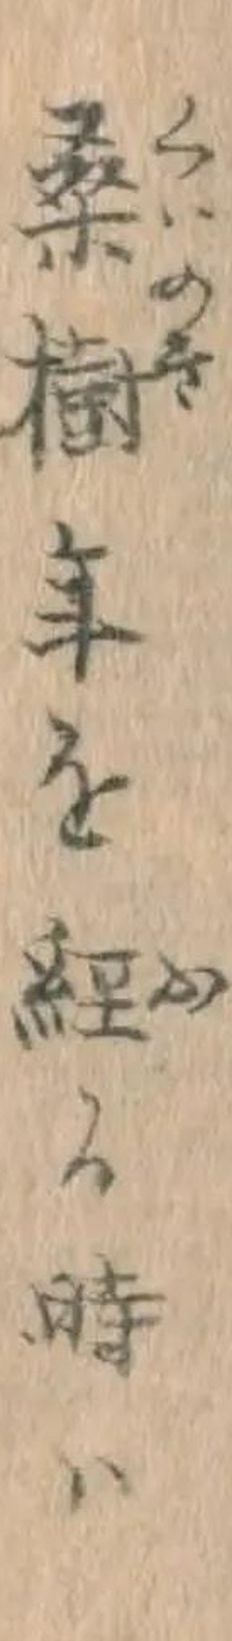桑樹年を経る時は
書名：本草図譜. 巻37-39
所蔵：国立国会図書館 National Diet Library, JAPAN
